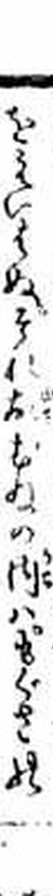をえいはぬそれをむねのうちはもぐさの
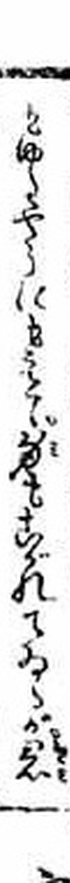もゆるやうにもえて身もこがれてゐるが君実
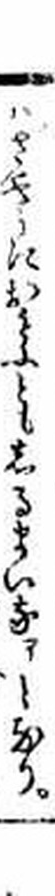はさやうにおもふともしるまいなぁとなり
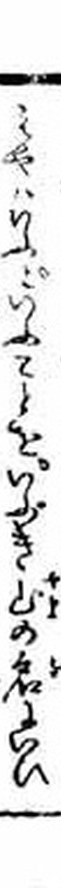えやはいふといふことをいぶき山の名にいひ方
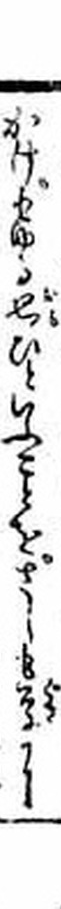かけもゆる思ひといふことをさしも草に
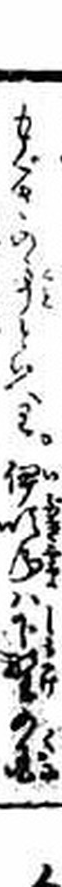もぐさの事をいへり伊吹山は下野の国
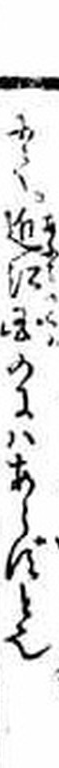にて近江の国にはあらずと也

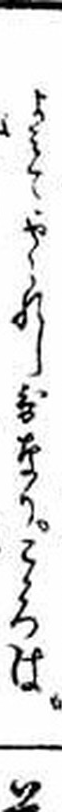よみてやられし哥なりこゝろは藤原
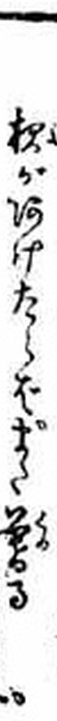夜があけたらばまた暮る
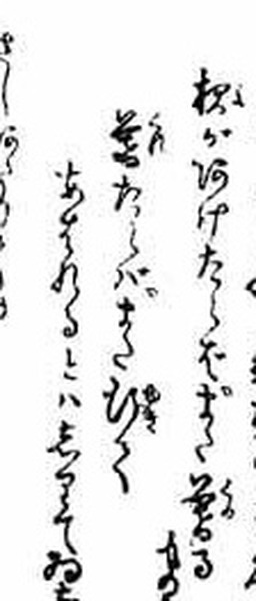暮たらばまた行て
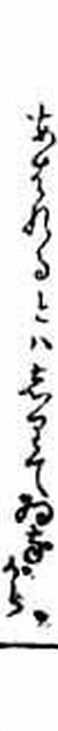あはれるとはしりてゐながら
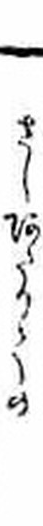さしあたりての
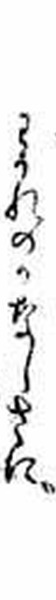わかれのかなしさに道
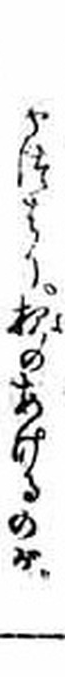やつはり夜のあけるのが信
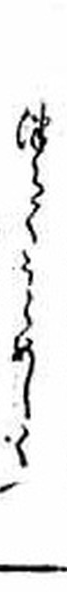つらくうらめしく
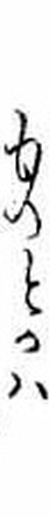ものとかは
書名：小倉百人一首
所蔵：東京学芸大学教育コンテンツアーカイブ
